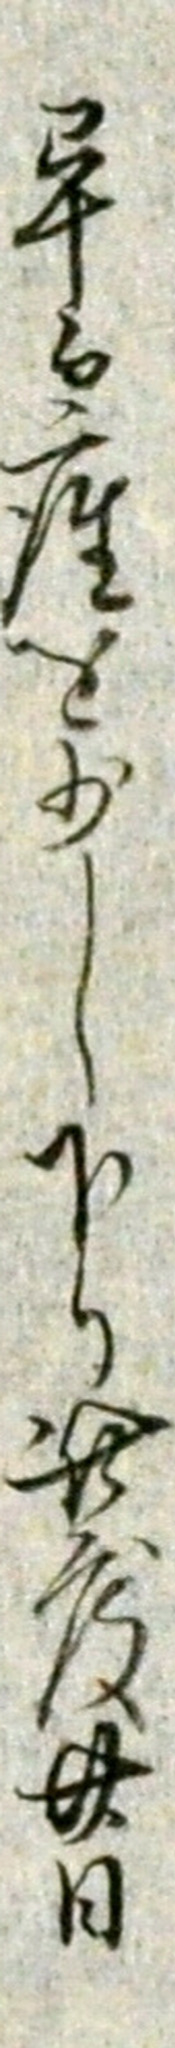畢而座を少し下り此度廿日
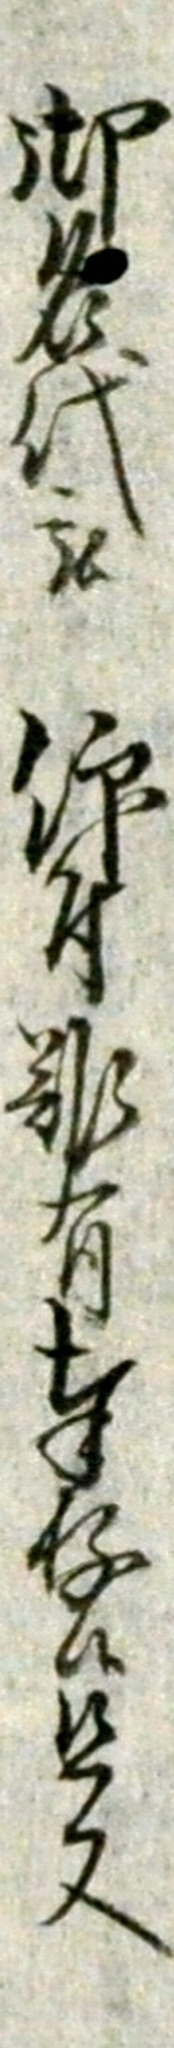御名代被仰付難有奉存候且又
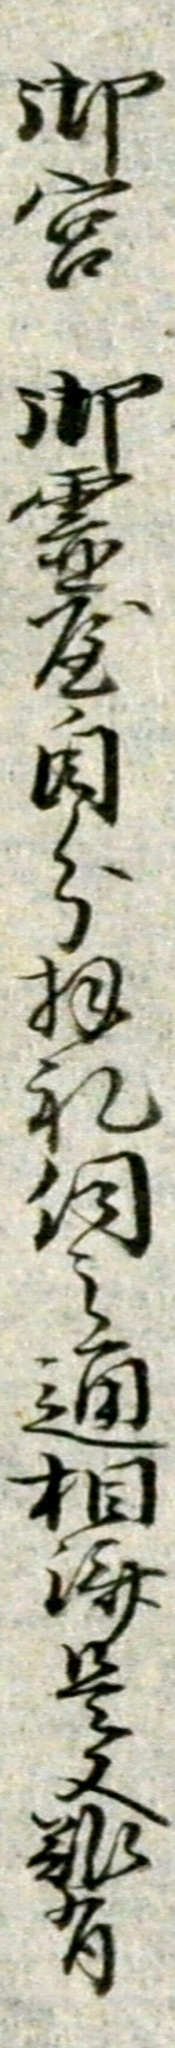御宮御霊屋自分拝礼伺之通相済是又難有
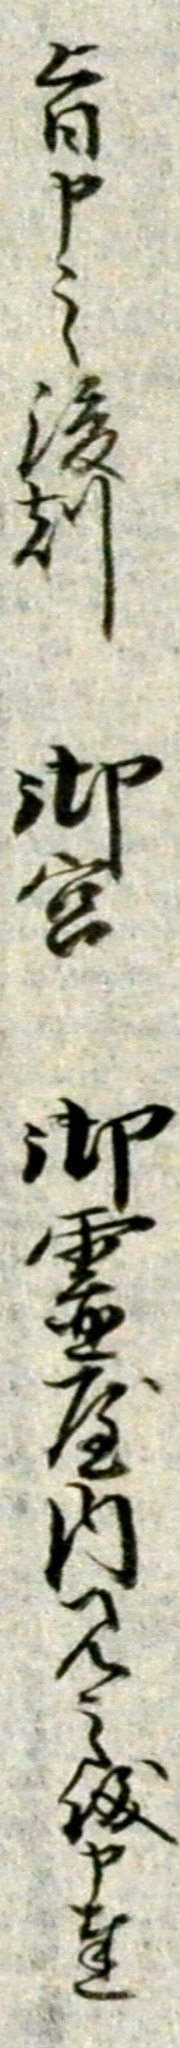旨申之後刻御宮御霊屋内見之儀申達
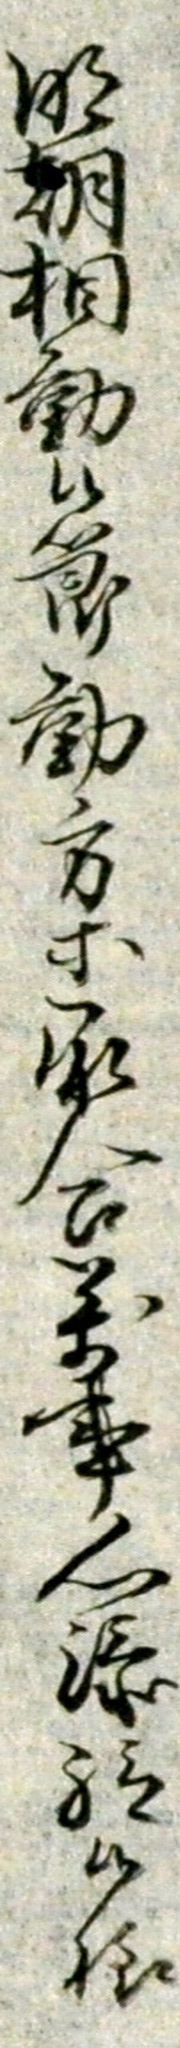明朝相勤候節勤方等承合万事心添給候様
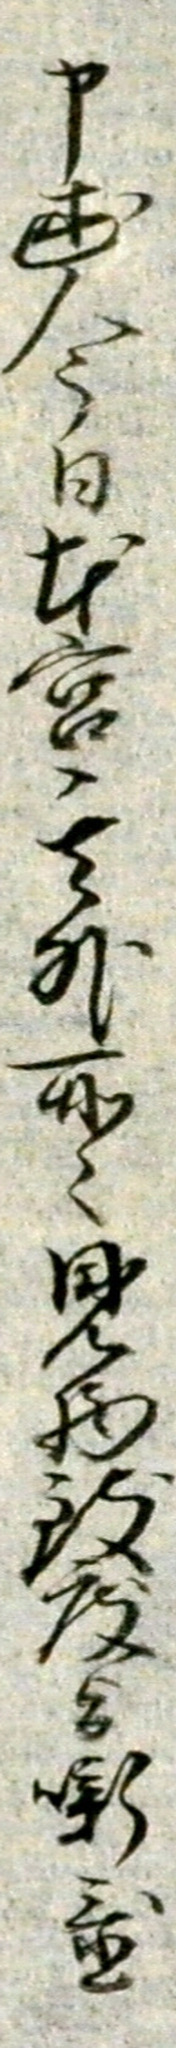申述今日本宮其外所々見物致度旨噺置
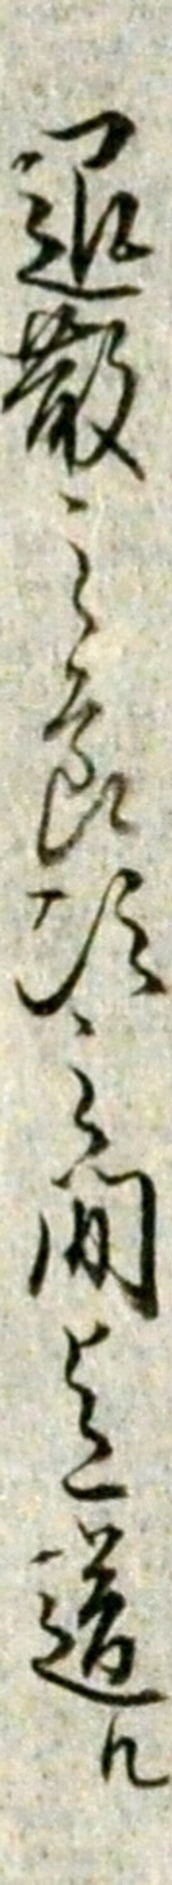退散之節次之間迄送ル
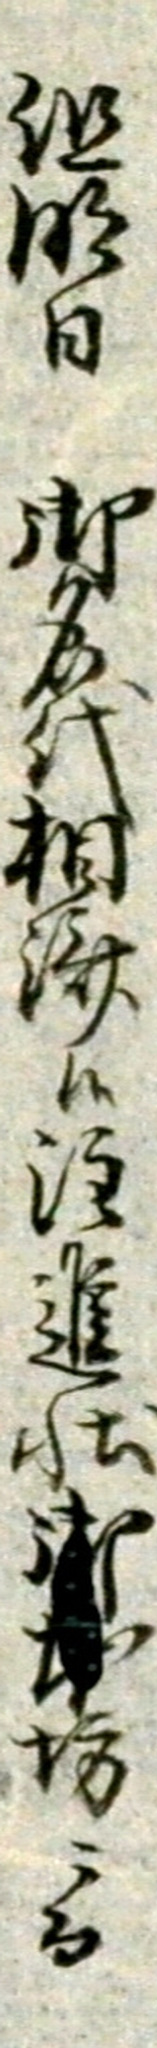但明日御名代相済候注進状御本坊ニ而
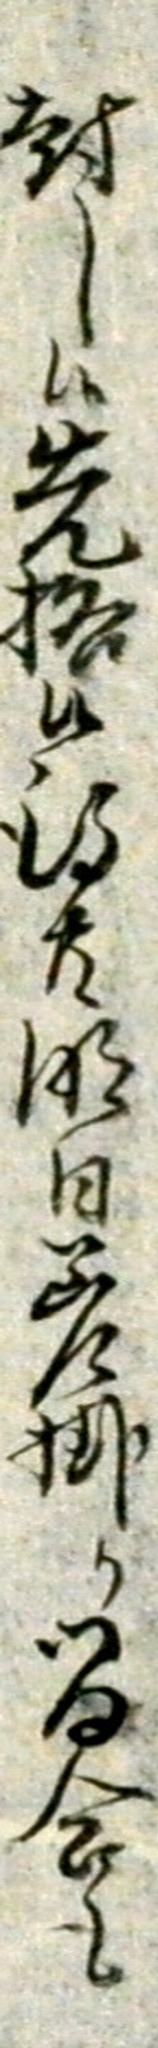封し候先格候得共明日差掛り留合も
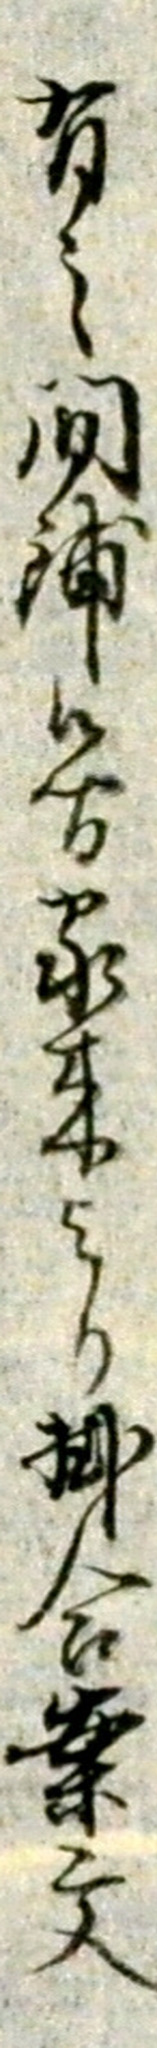有之間鋪候間家来より掛合案文
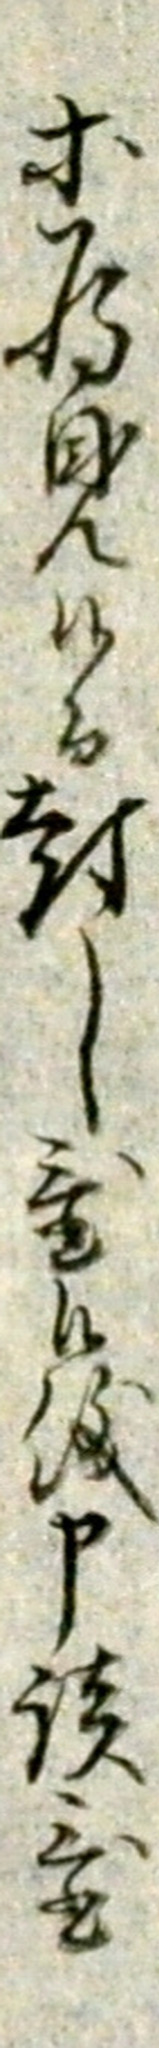等為見候而封し置候儀申談置
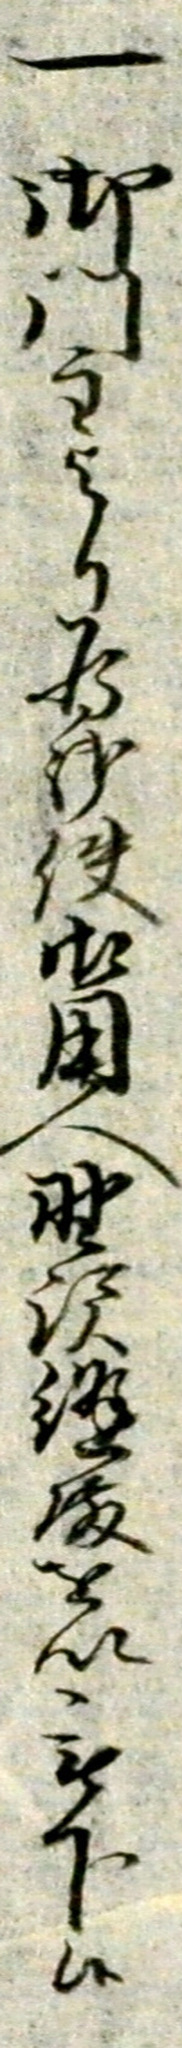一御門主より為御使御用人野沢縫殿を以被下候
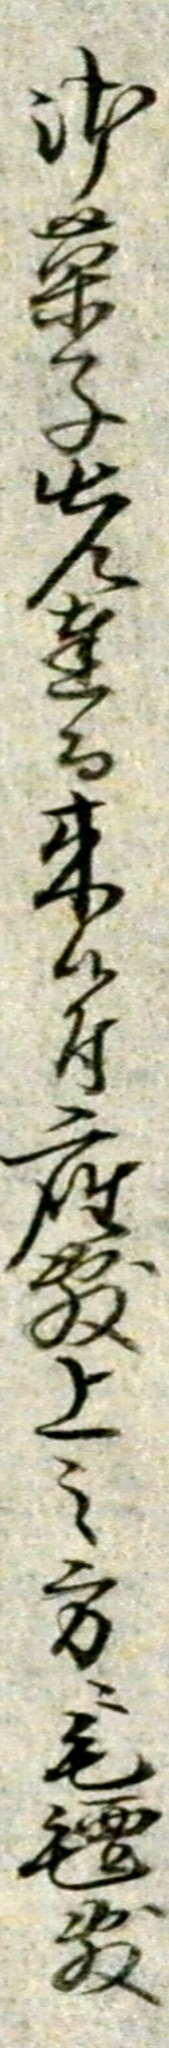御菓子先達而来候付座敷上之方ニ毛氈敷
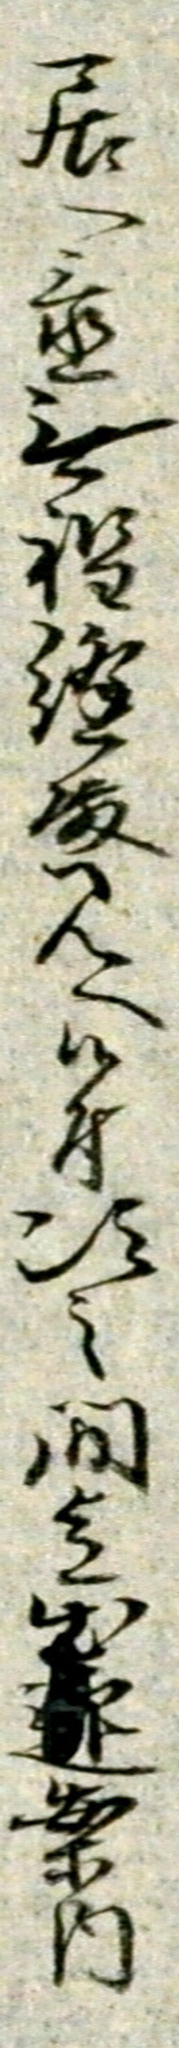居へ置無程縫殿見へ候付次之間迄出迎案内
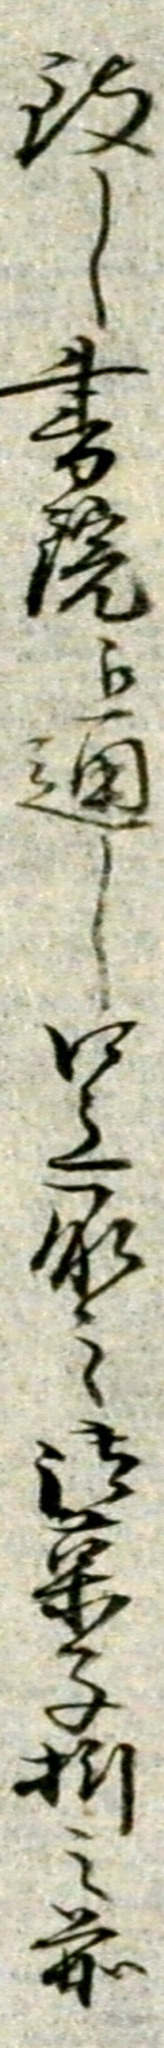致し書院江通し口上承之御菓子折之前
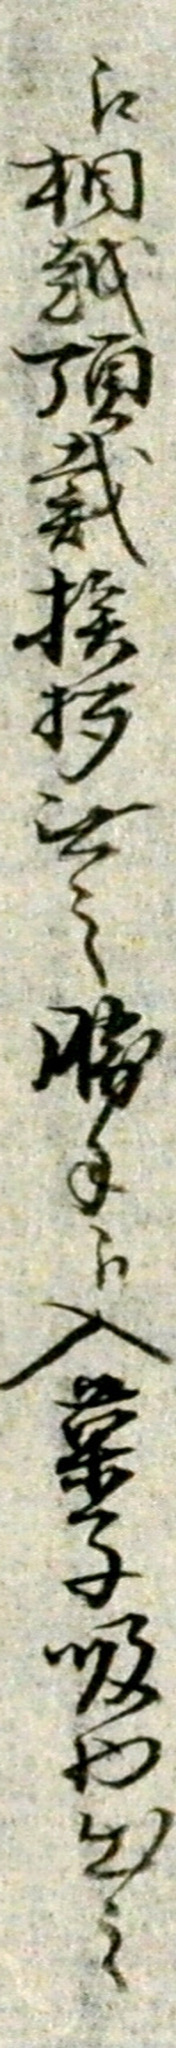江相越頂戴挨拶無之勝手江入菓子吸物出之
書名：日光御名代相勤候節ノ留
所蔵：伊那市立高遠町図書館・合同会社AMANE
